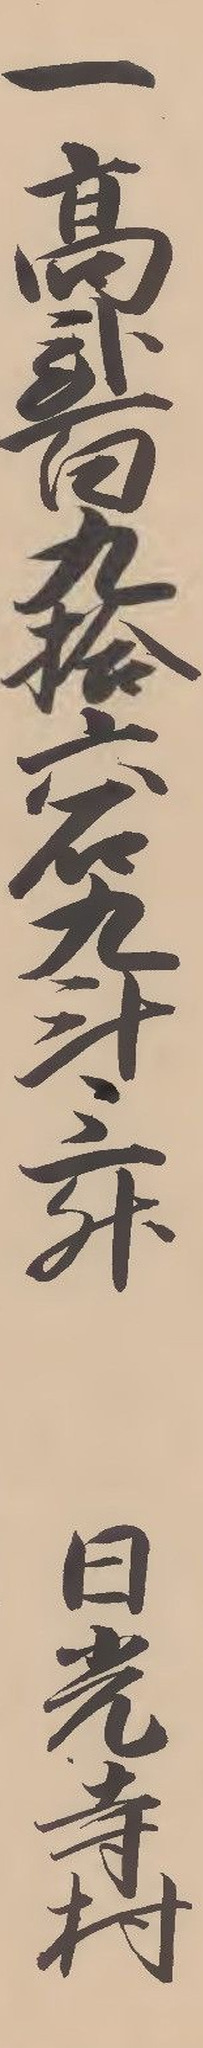一高弐百九拾六石九斗三升日光寺村
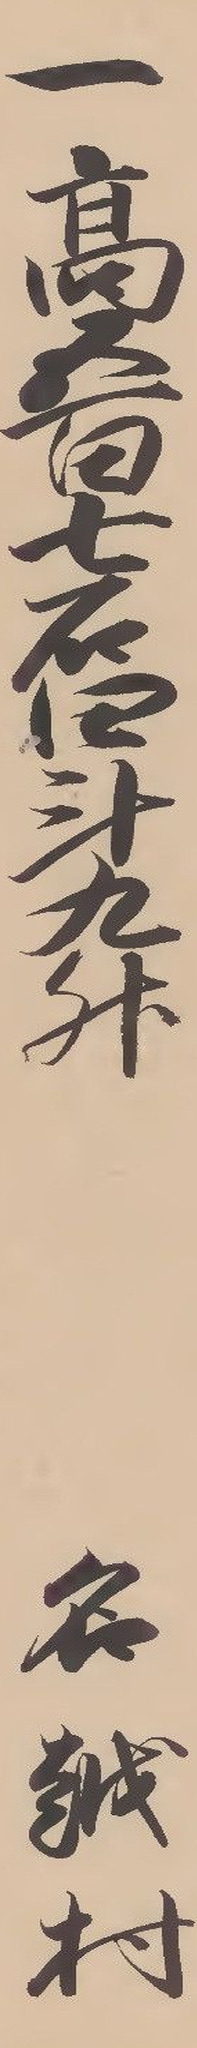一高五百七石四斗九升名越村

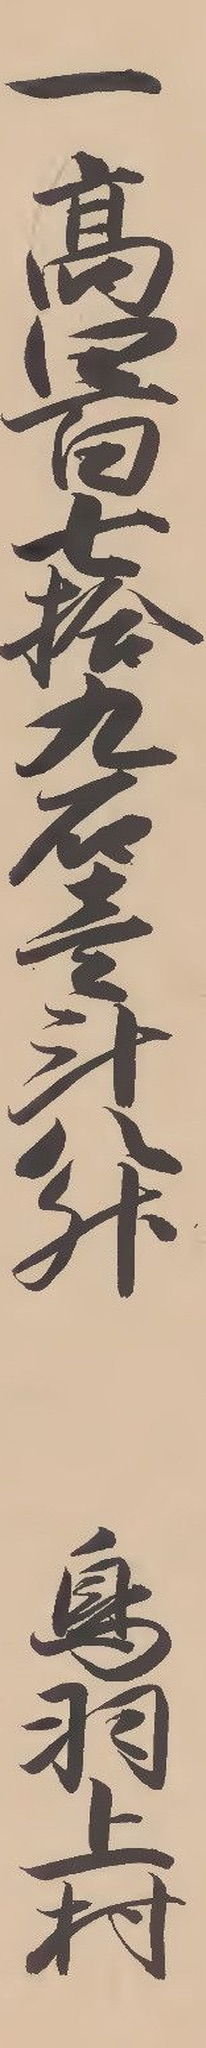一高四百七拾九石壱斗八升鳥羽上村
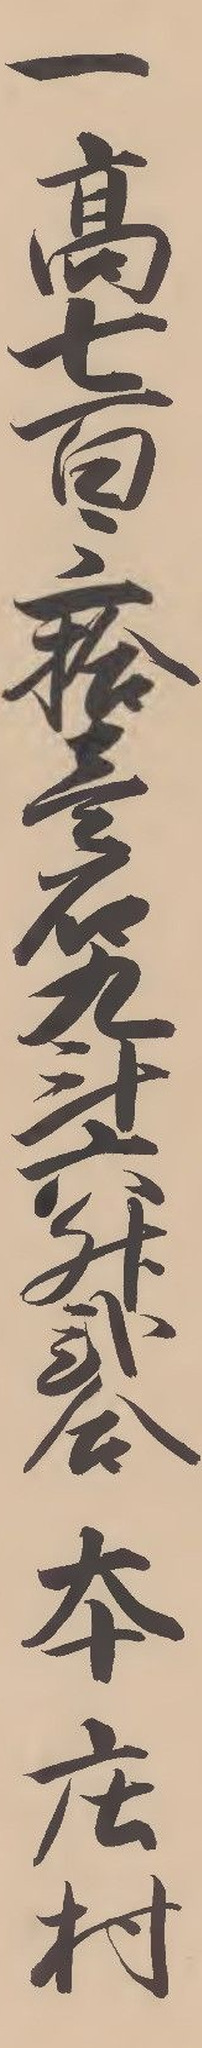一高七百三拾壱石九斗六升弐合本庄村
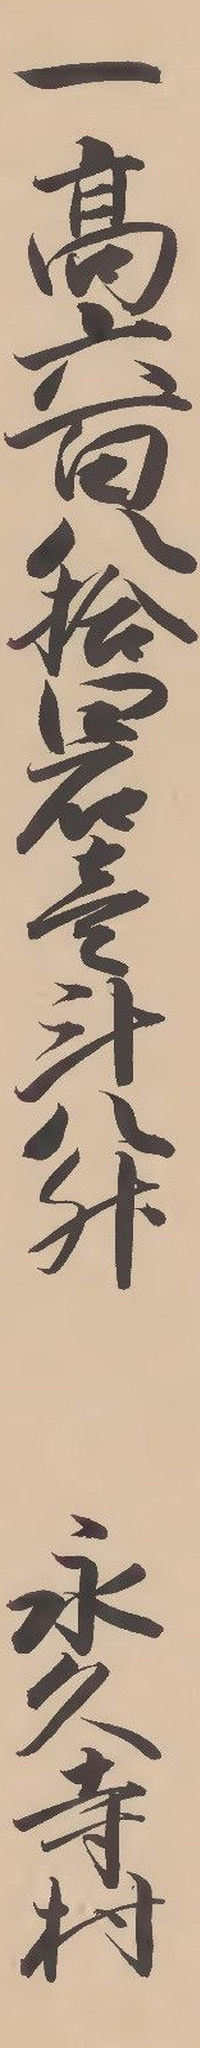一高六百八拾四石壱斗八升永久寺村
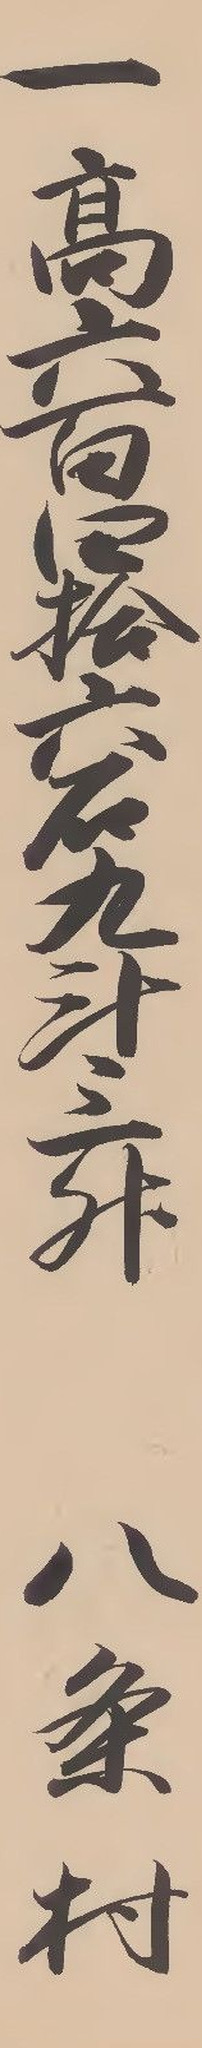一高六百四拾六石九斗三升八条村
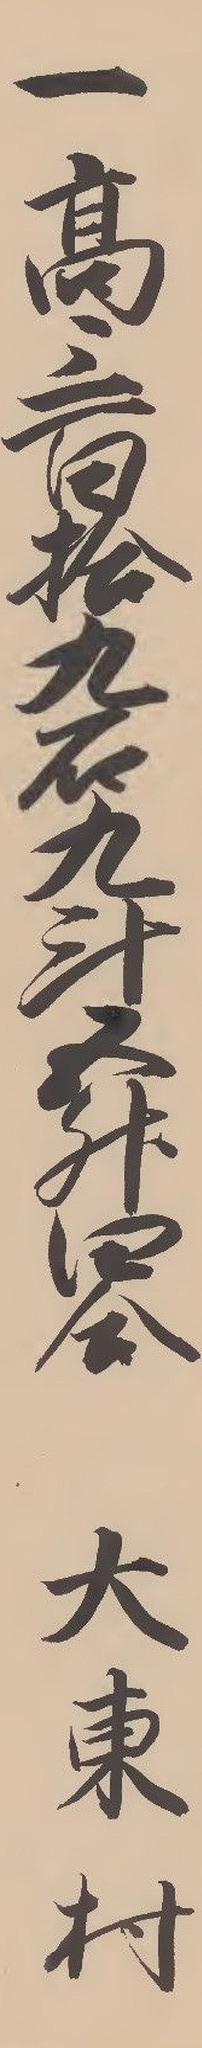一高三百拾九石九斗五升四合大東村
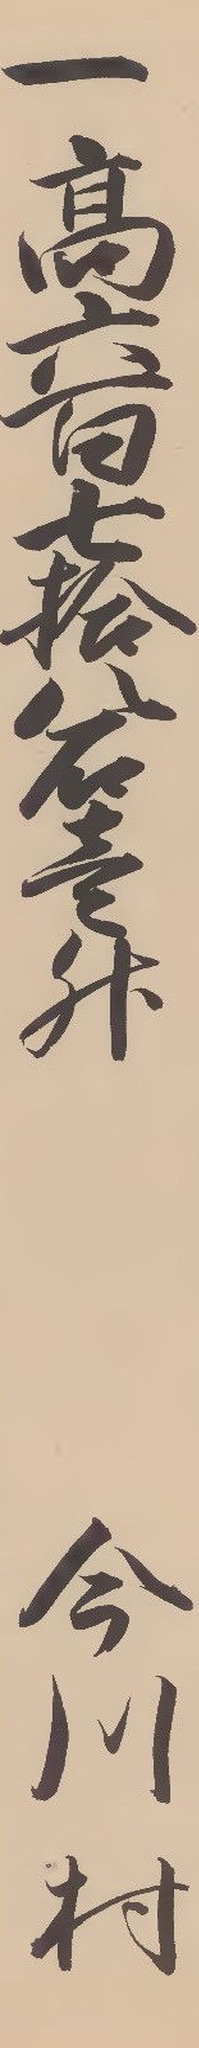一高六百七拾八石壱升今川村

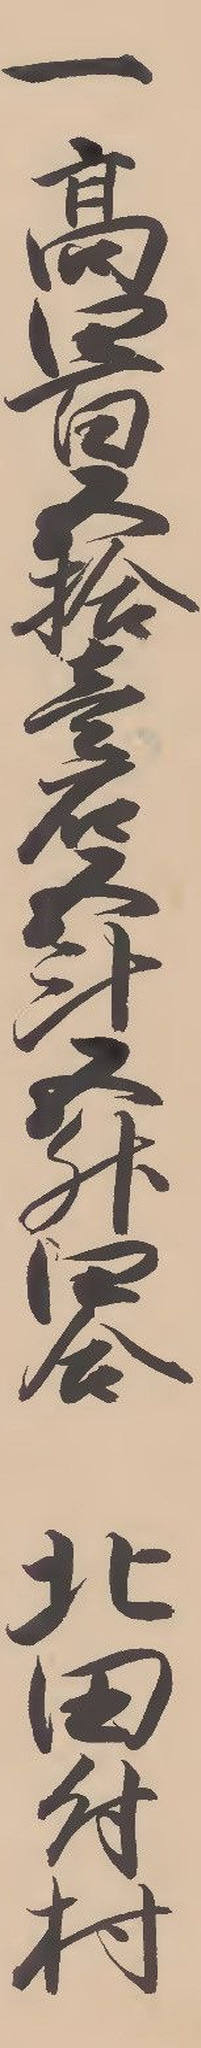一高四百五拾壱石五斗五升四合北田付村
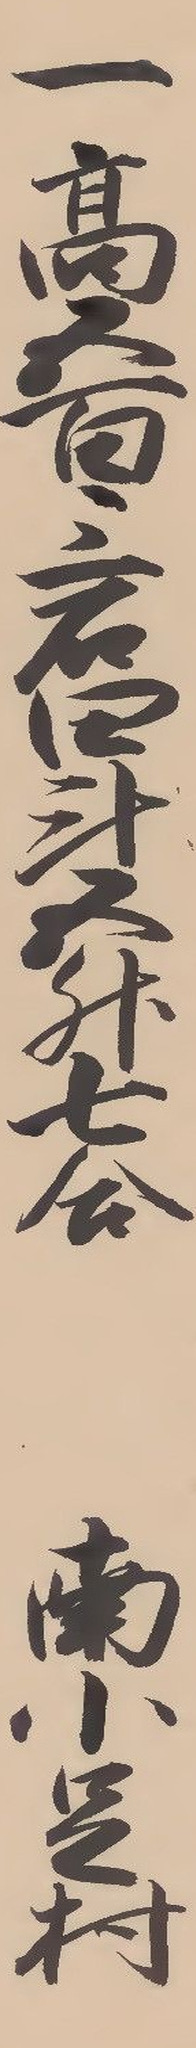一高五百三石四斗五升七合南小足村
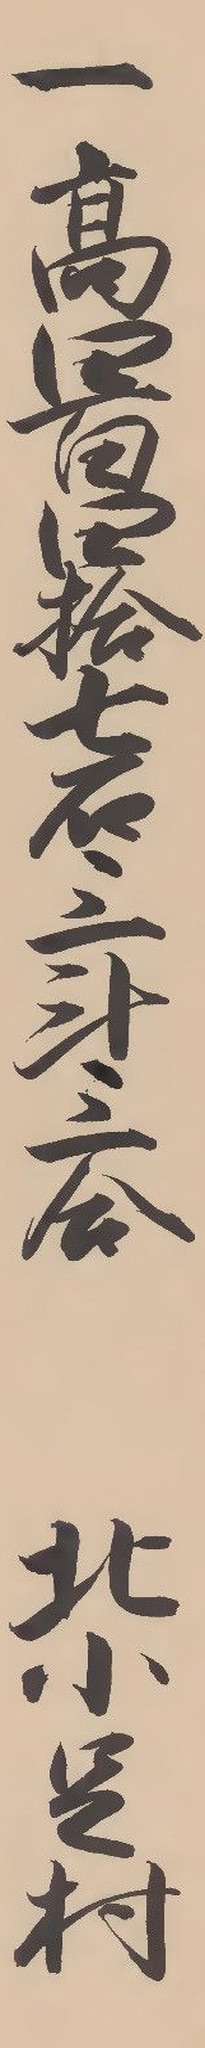一高四百四拾七石三斗三合北小足村
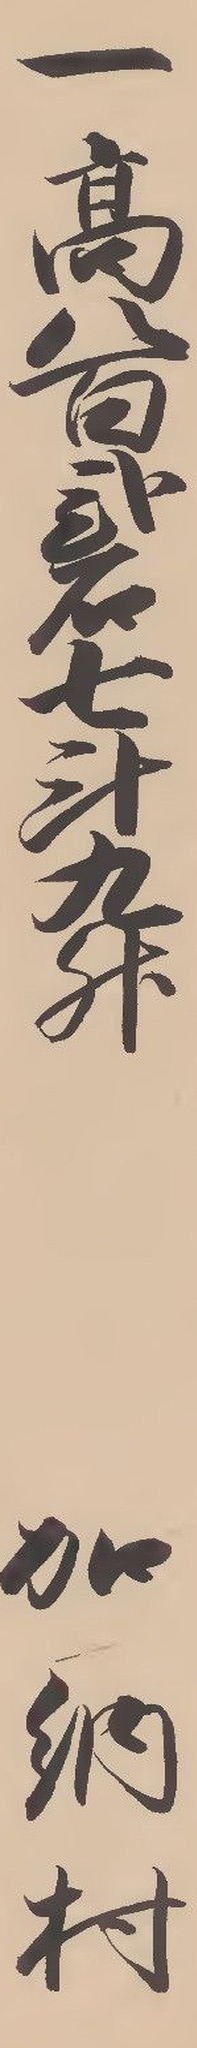一高八百弐石七斗九升加納村
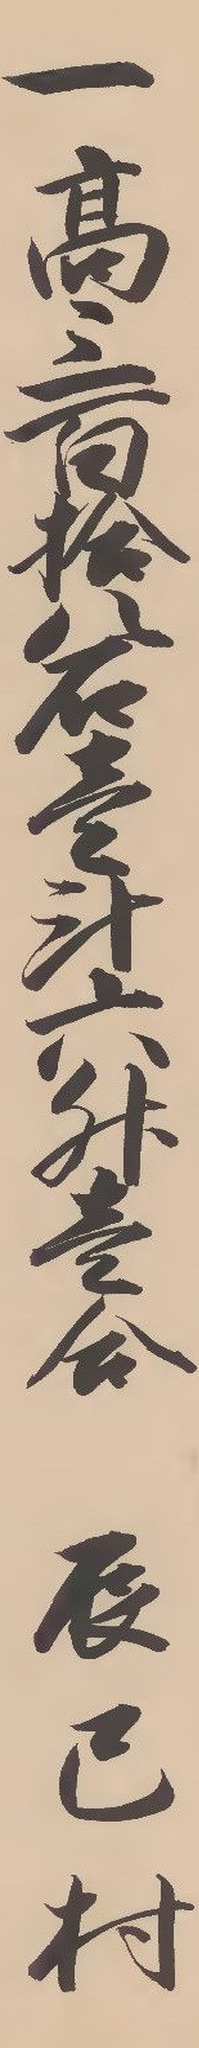一高三百拾八石壱斗六升壱合辰巳村
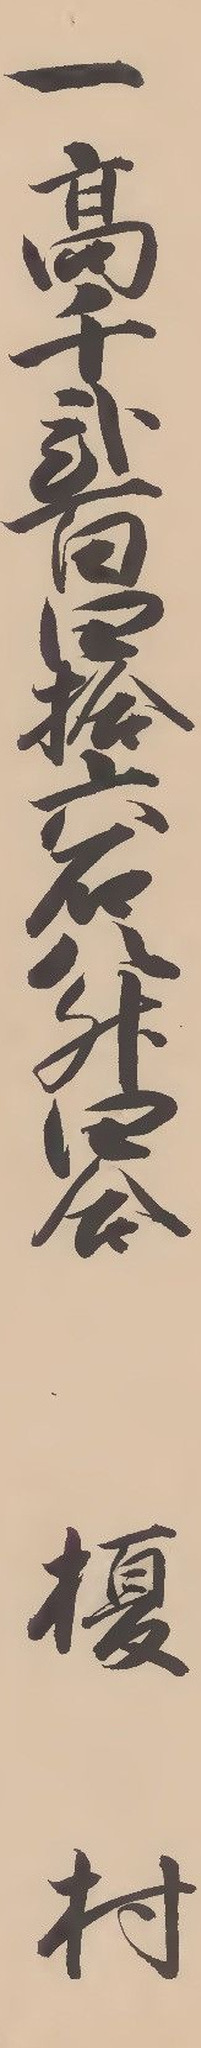一高千弐百四拾六石八升四合榎村
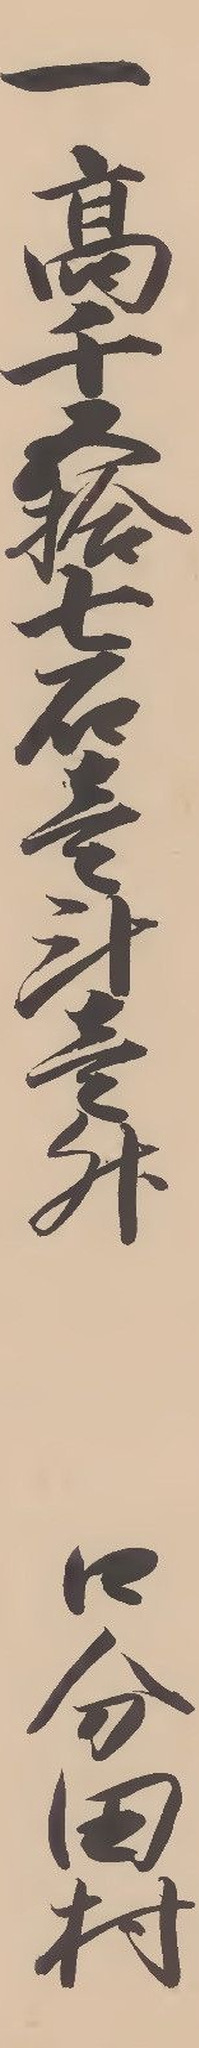一高千五拾七石壱斗壱升口分田村
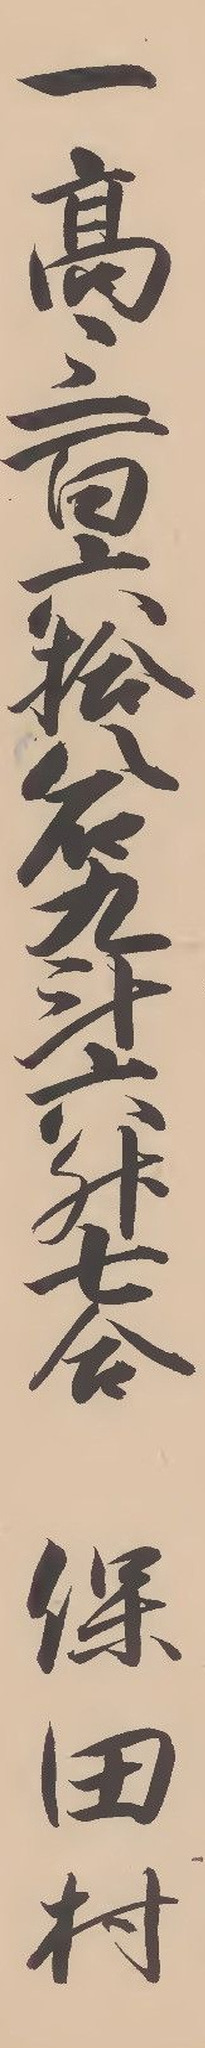一高三百六拾八石九斗六升七合保田村
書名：近江国郷帳
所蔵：国立公文書館 National Archives of Japan
